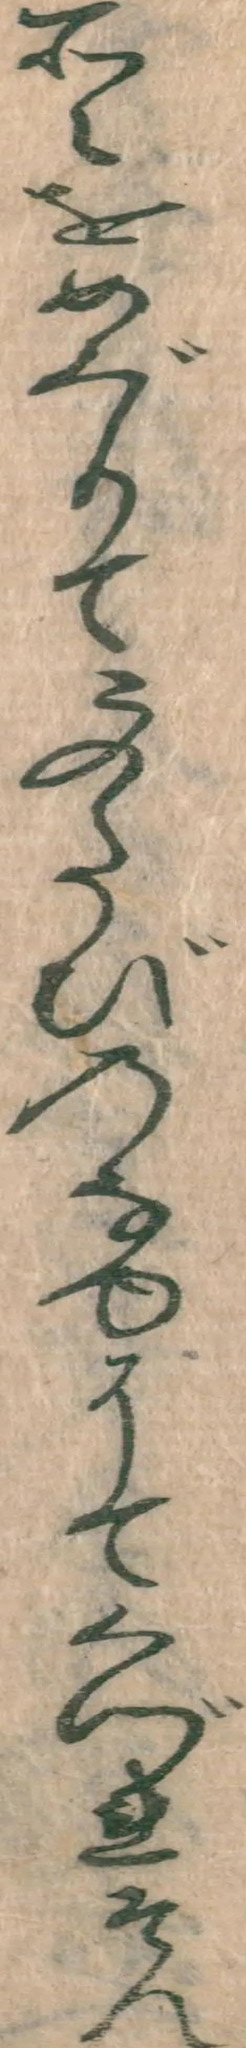所々をめぐりてこのたびのなゆにてくずれそん
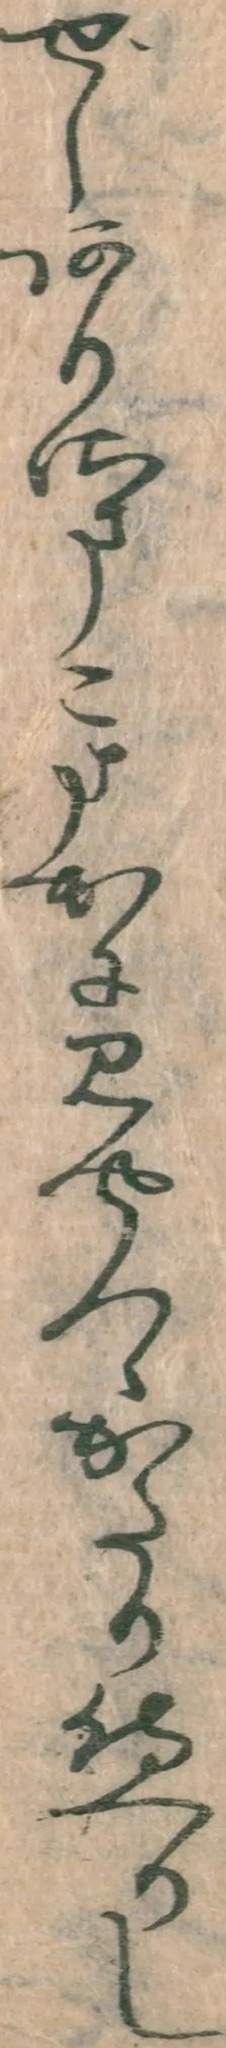せしありさまこまかに見聞しつゝかたり侍へりし
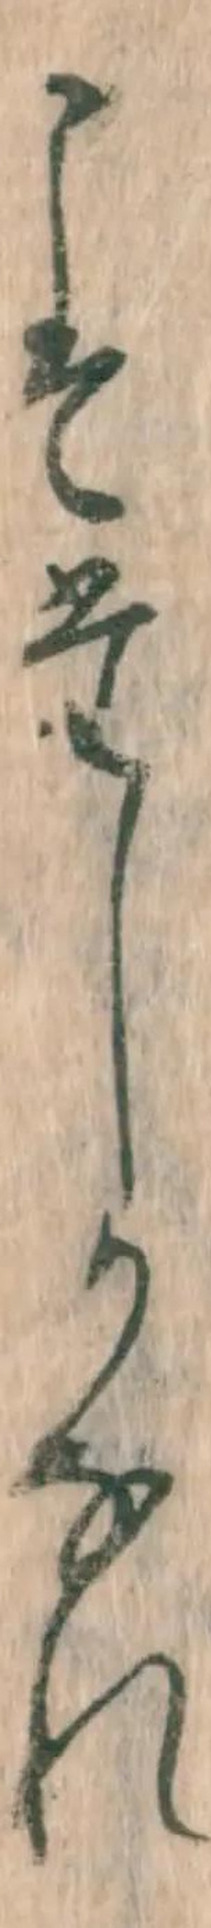こそたしかなれ

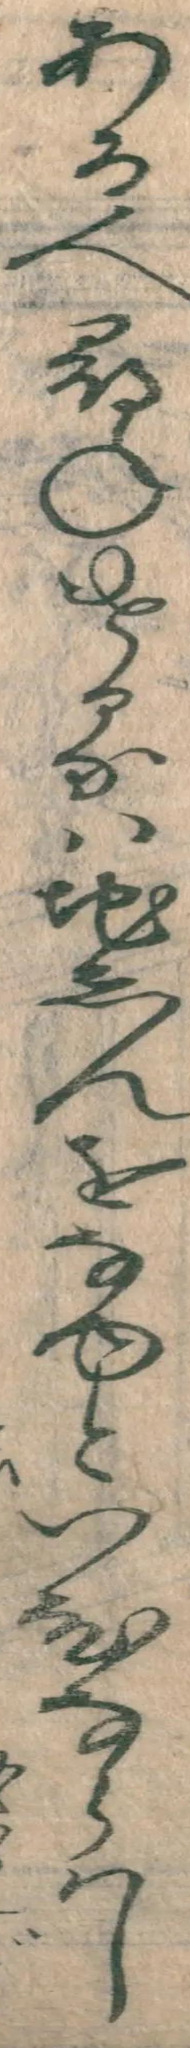ある人尋ねけるは地しんをなゆといひならはし
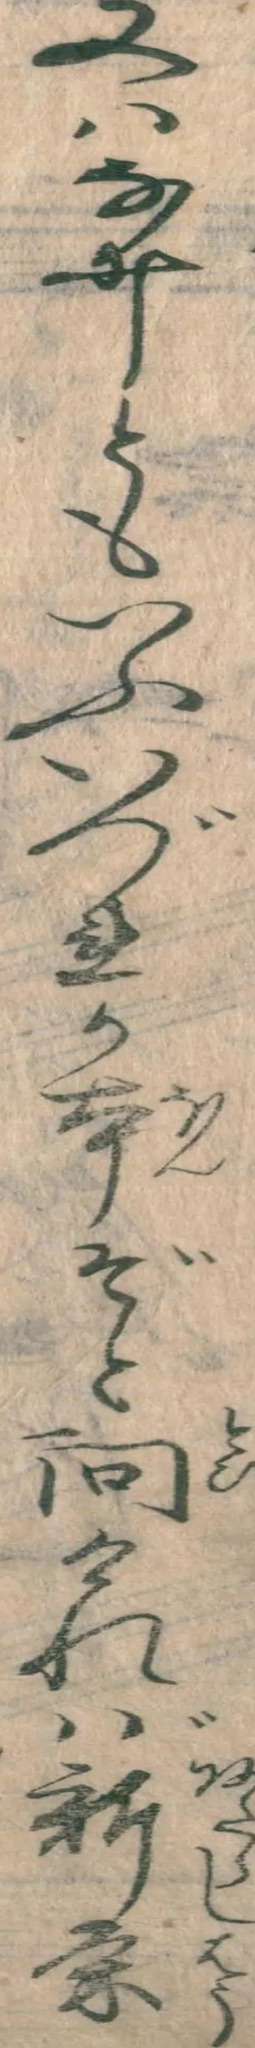又はなゐともいふいづれか本ぞと問ければ新房
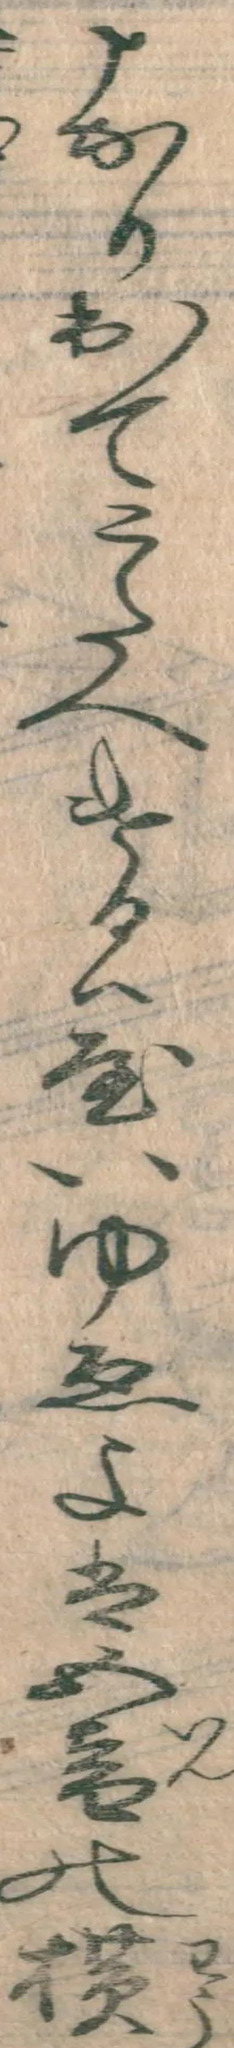うかり出てこたへけるはやいゆゑよは五音の横
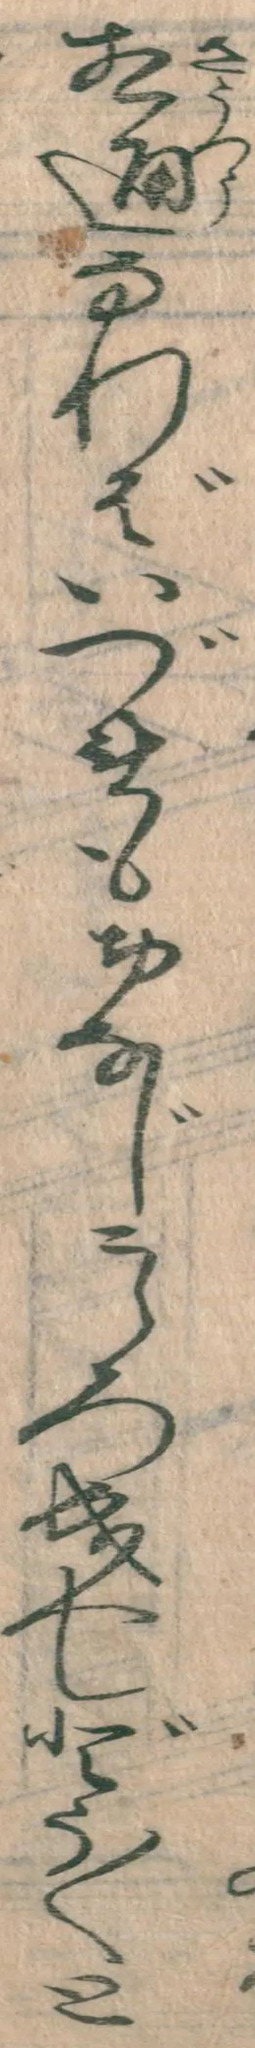相通なればいづれもおなじこゝろ成へしどう〳〵と
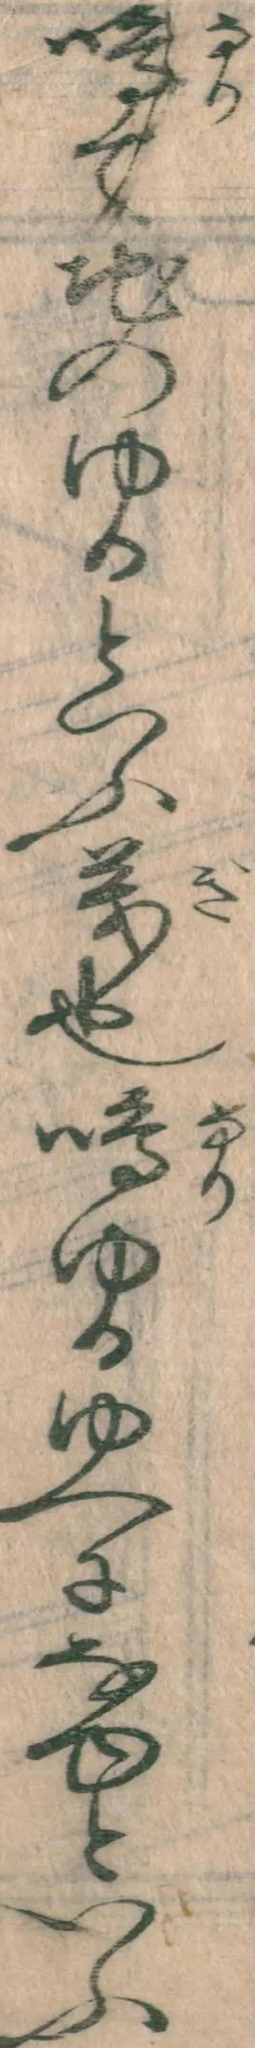鳴て地のゆるといふ義也鳴ゆるゆへになゆといふ
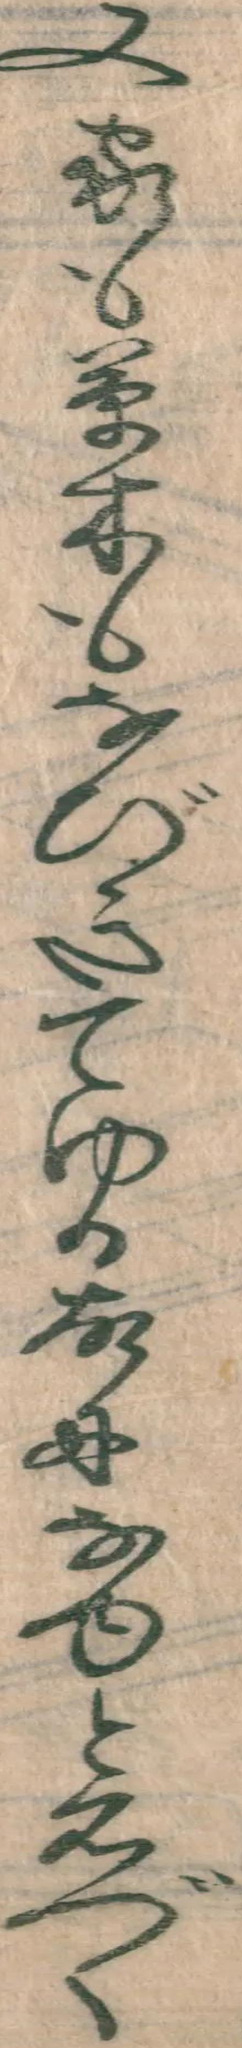又家も草木もなびきてゆる故になゆと名づく
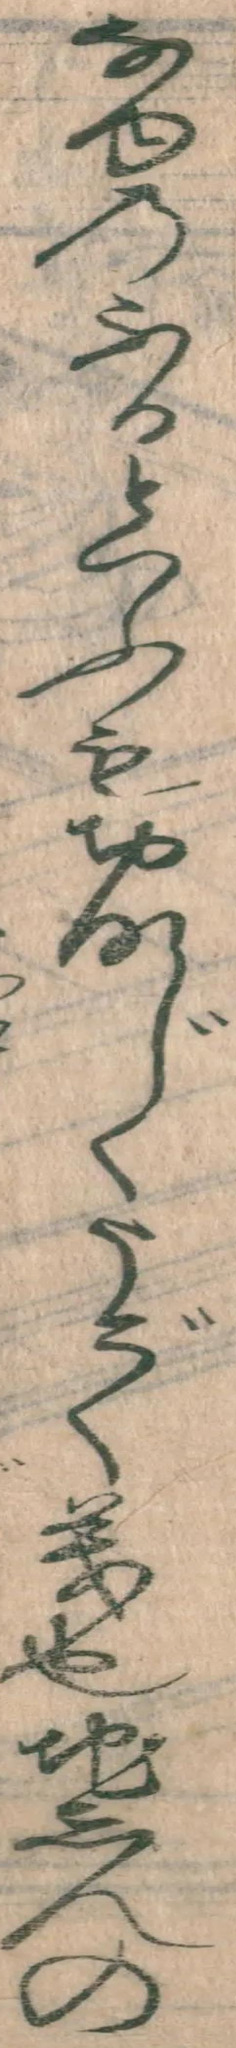なゆのふるといふもおなじくうごく義也地しんの
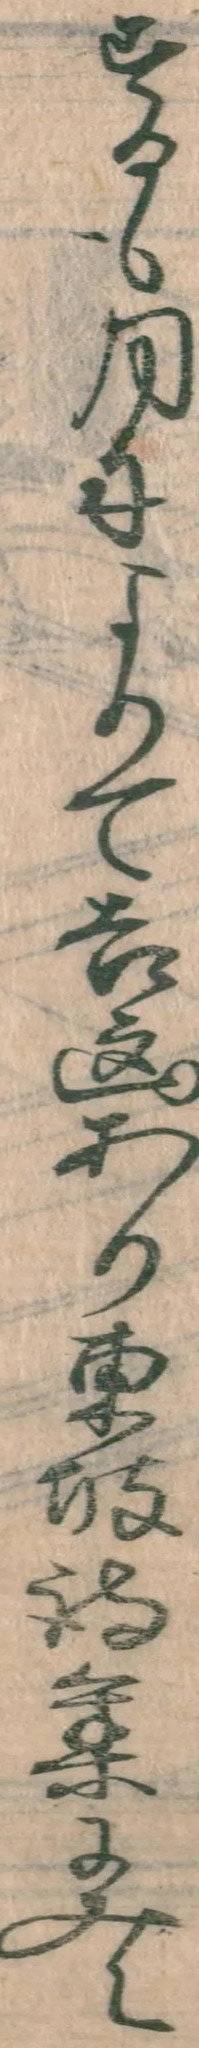するも月によりて吉凶あり東坡詩集にみえ
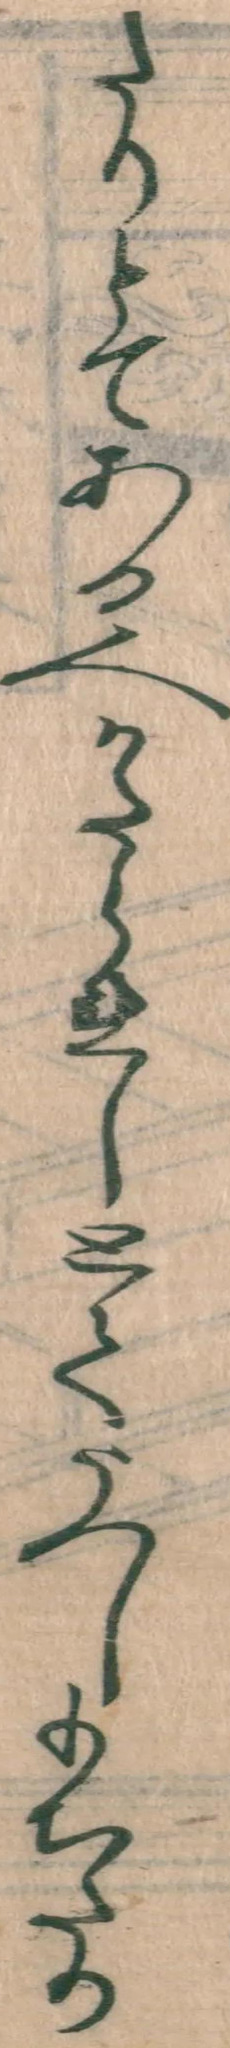たりとてある人かたられしとてうつしもちたり
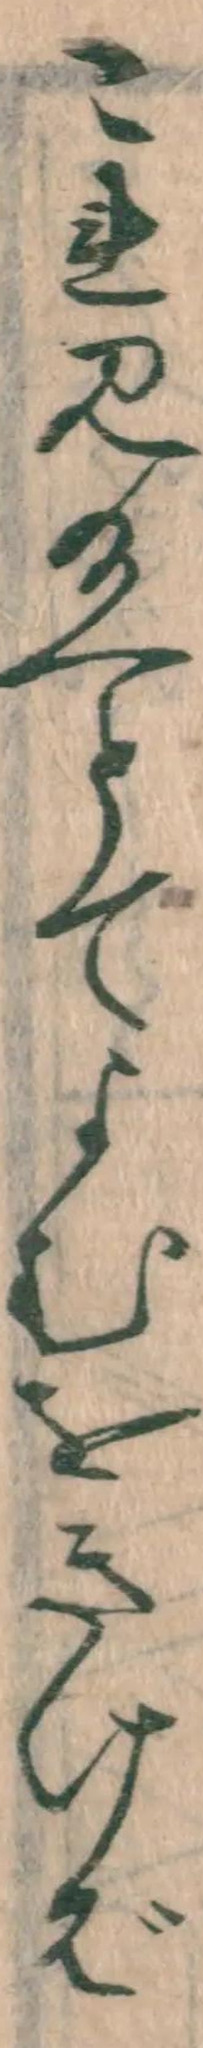これ見給へとてよむをきけば
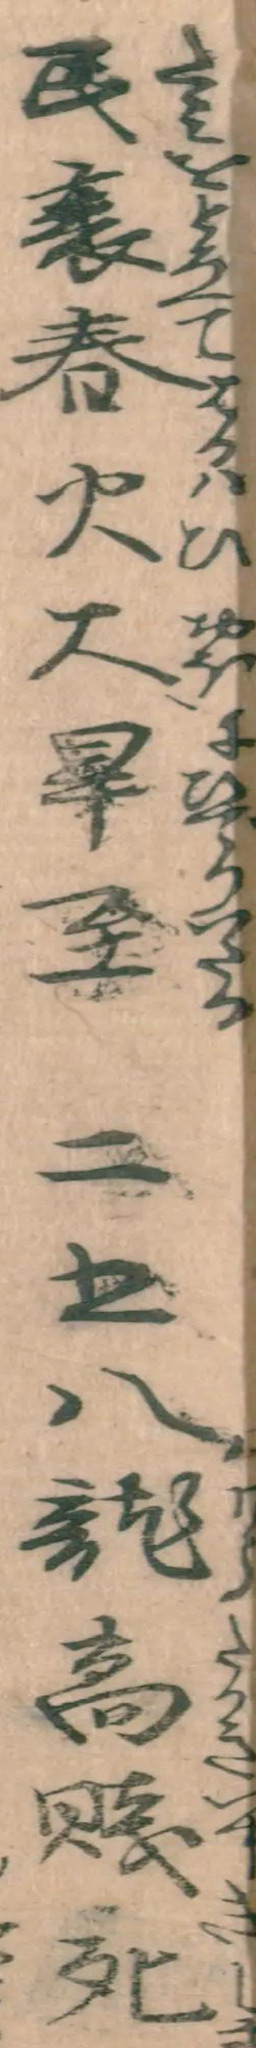民褱春火大旱至二五八は龍高賤死
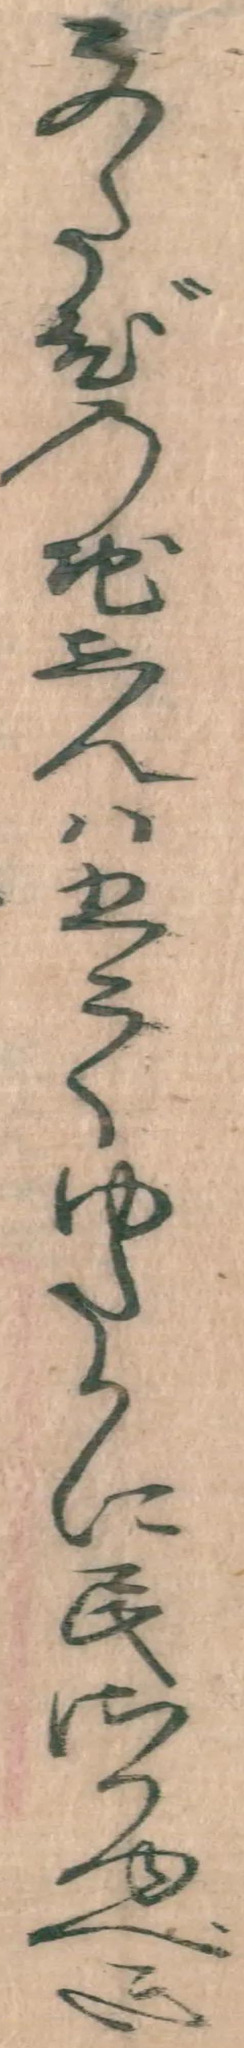このたびの地しんは五こくゆたかに民さかゆべき
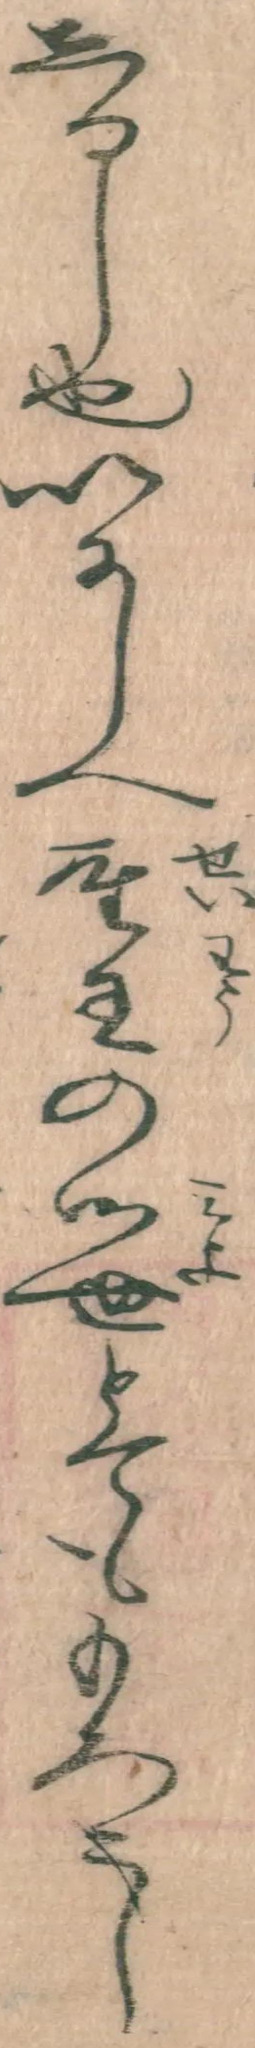しるし也いにしへ聖王の御世とてももろこし
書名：艱難目異志. 上,下
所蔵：国立国会図書館 National Diet Library, JAPAN
